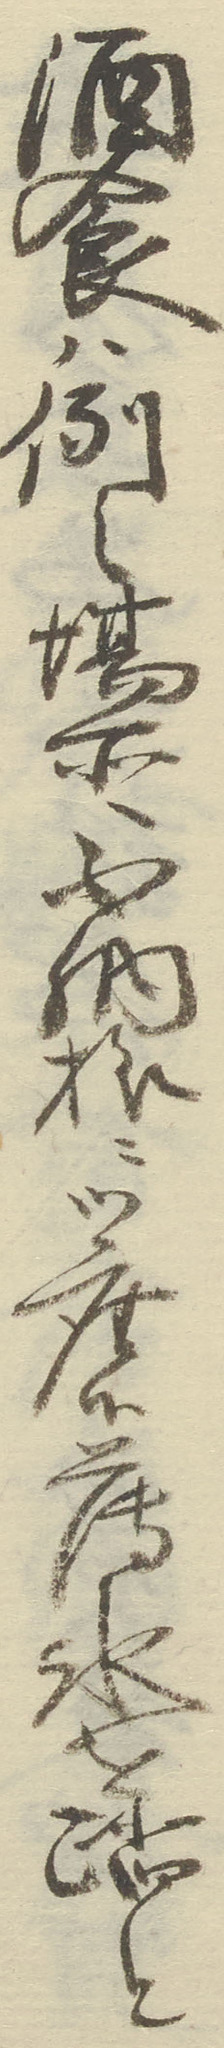酒食ハ例之場所へ不納様ニ御座候薄氷を踏と
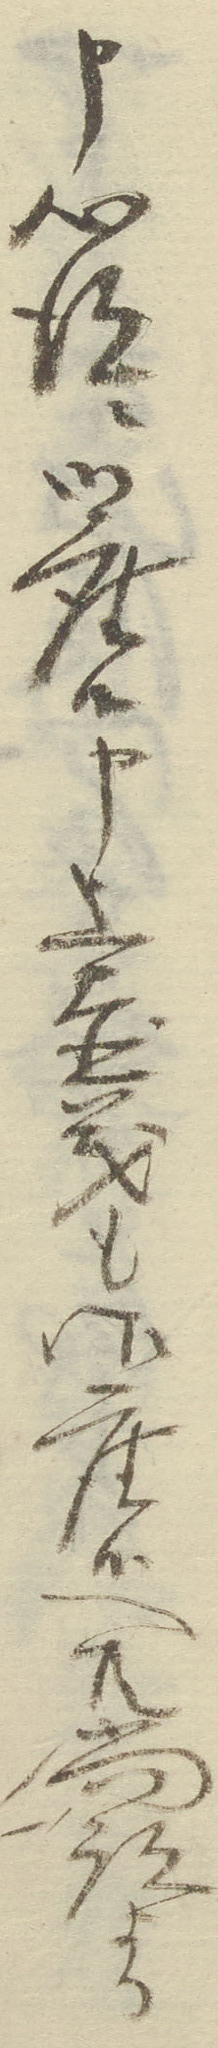申心得ニ御座候申上置義も御座候へ共尚跡より

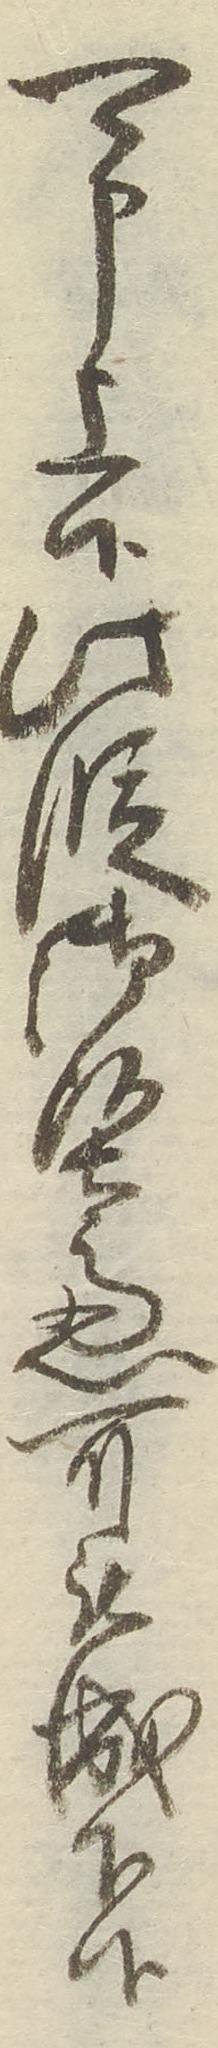可申上候此段御堅慮可被成下候
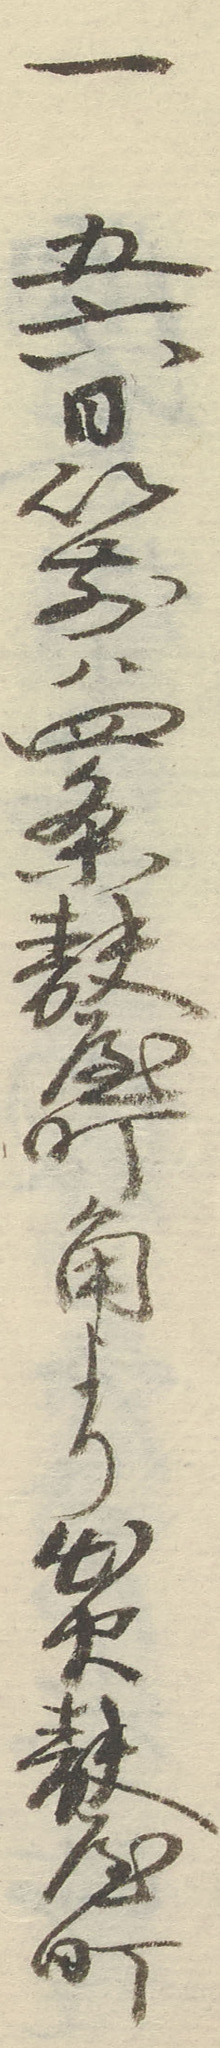一五六日以前ハ四条麩屋町角より出火麩屋町
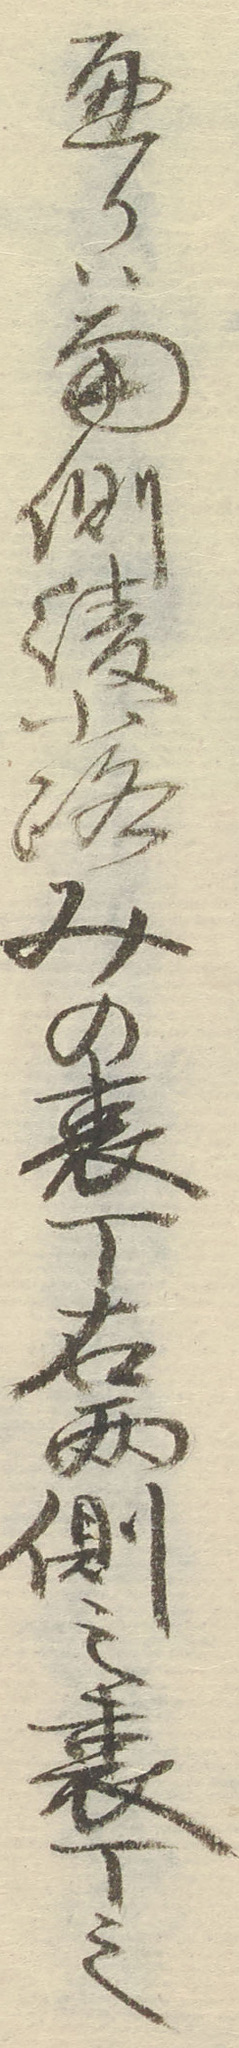通りハ南側綾小路みの裏丁右両側之裏丁之
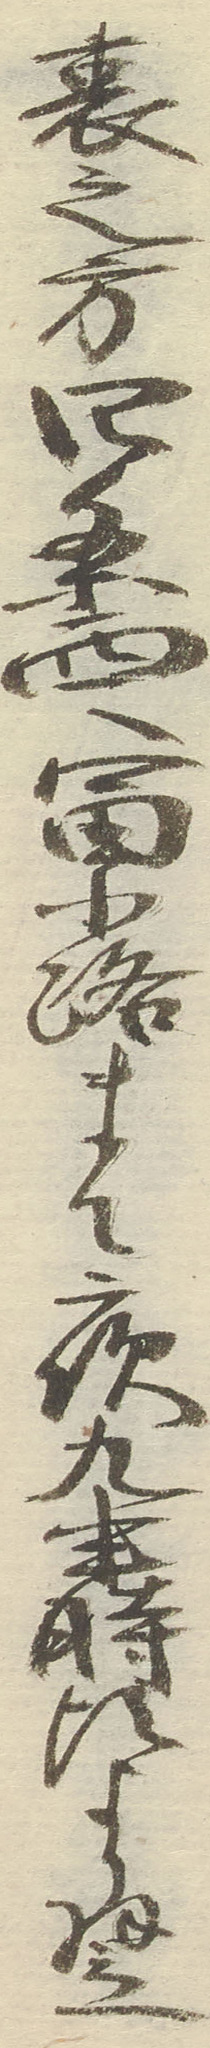裏之方四条西へ富小路まて夜九半時頃より翌
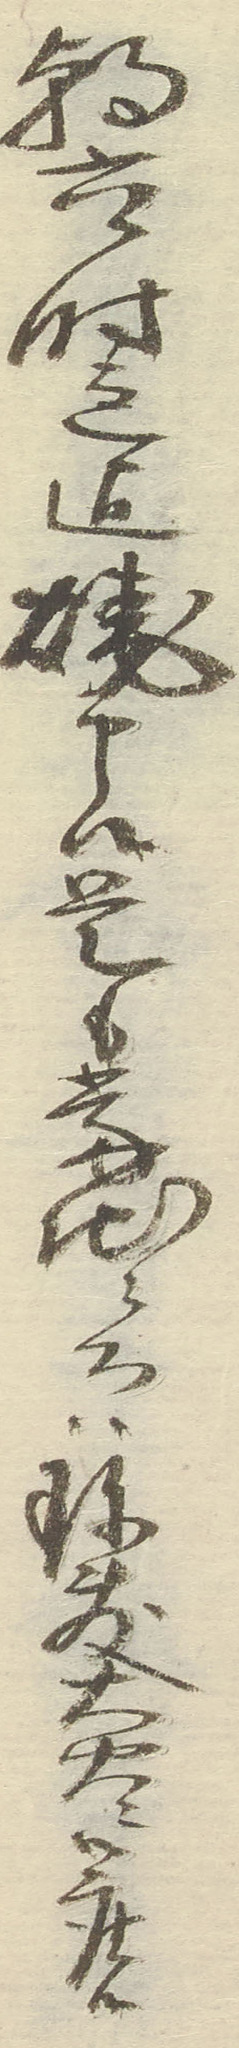朝六ツ時過迄焼申候是も當地ニ而ハ珍敷大火ニ御座候
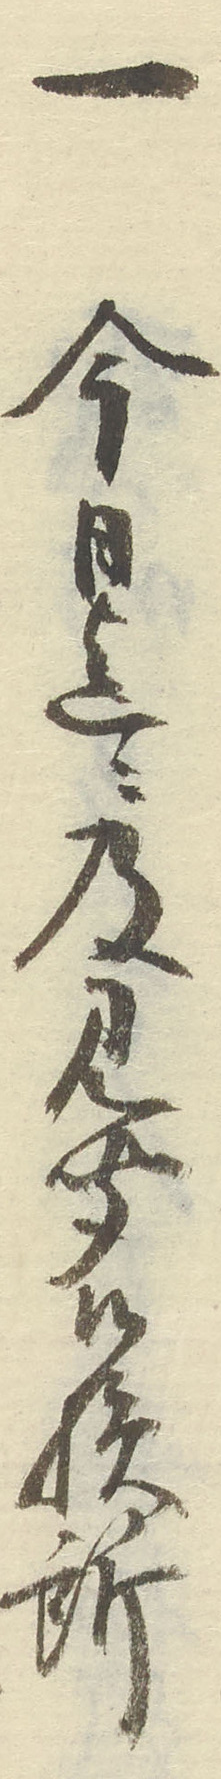一今日迄ニ及見聞候損所
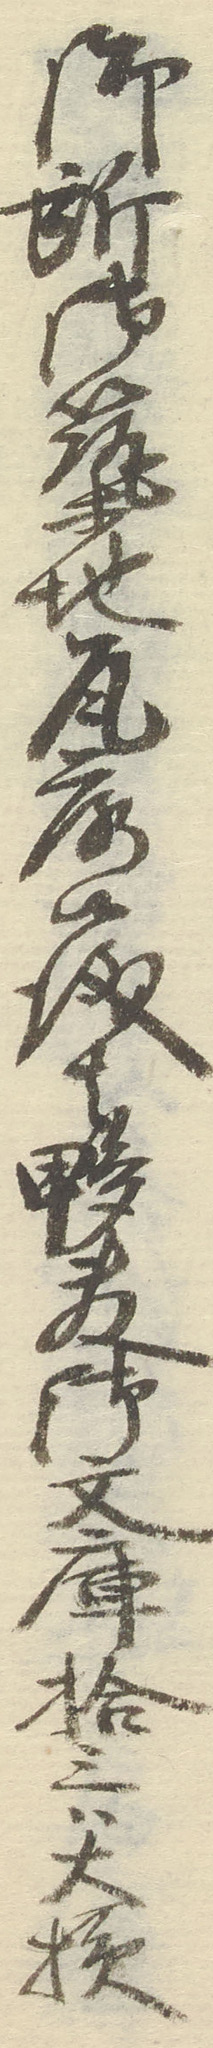御所御築地瓦落候儀は夥敷御文庫拾三ハ大損
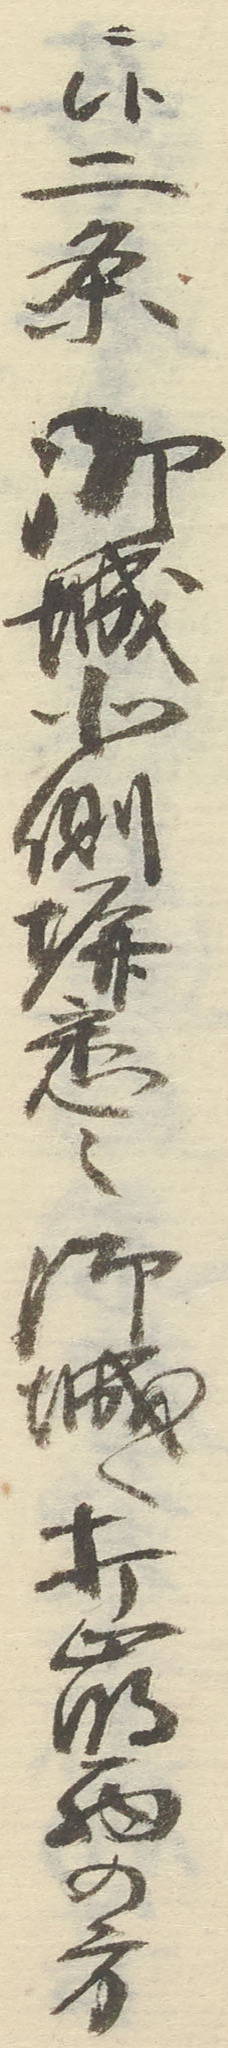ニ候二条御城北側塀悉く御城へ打崩れ西の方
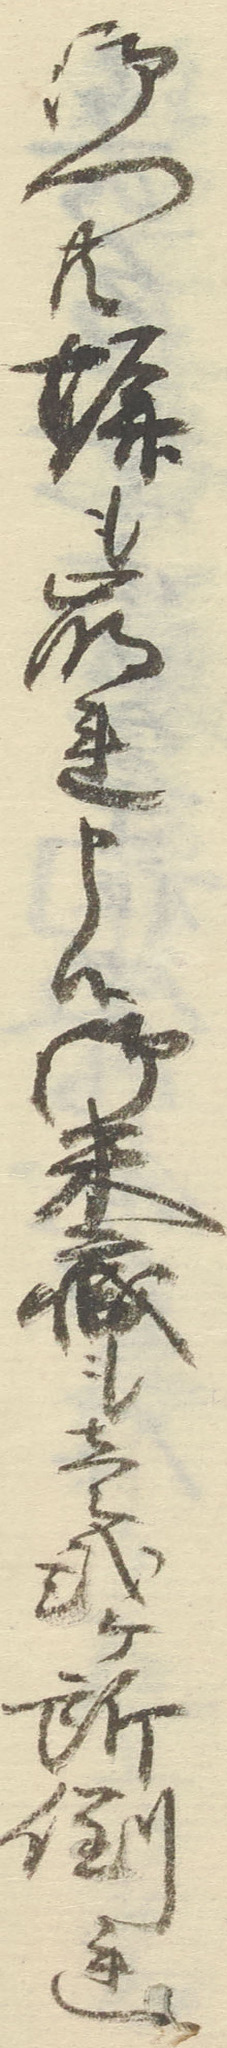御門共塀も崩れ申候御米蔵も壱弐ヶ所倒れ
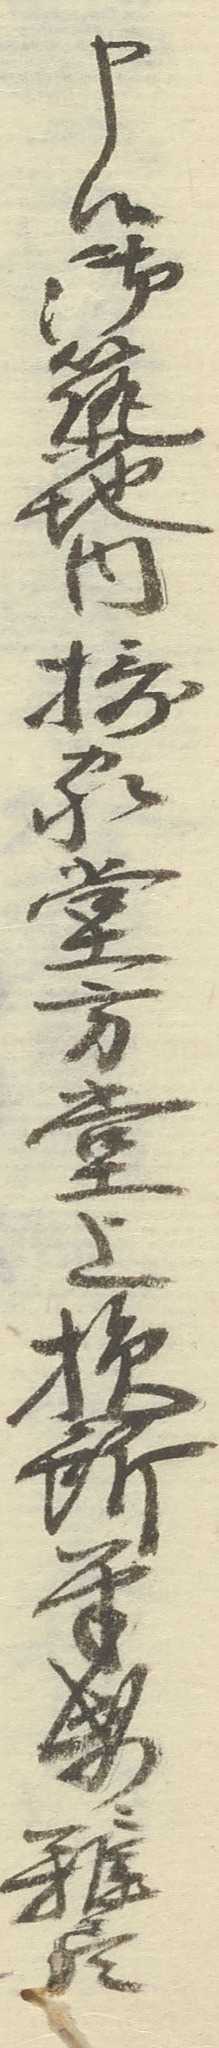申候御築地内摂家堂方堂上損所筆紙ニ難尽
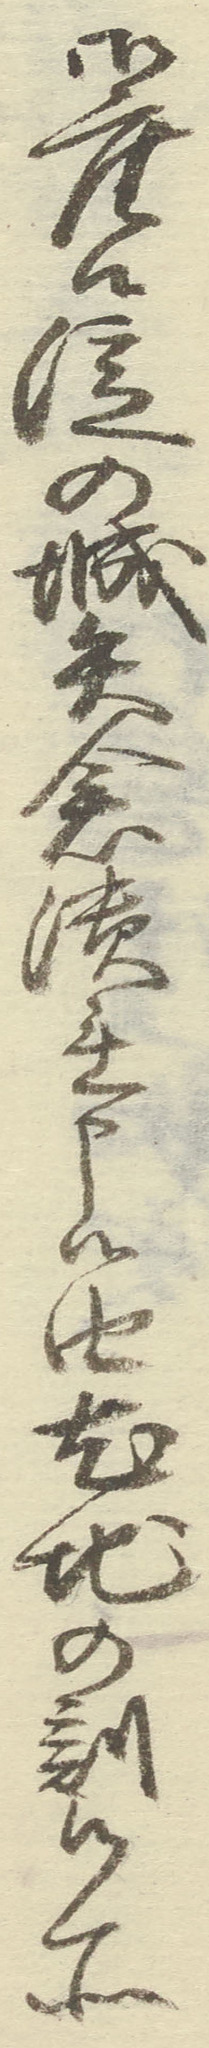御座候淀の城矢倉潰れ申候由尤地の割候所
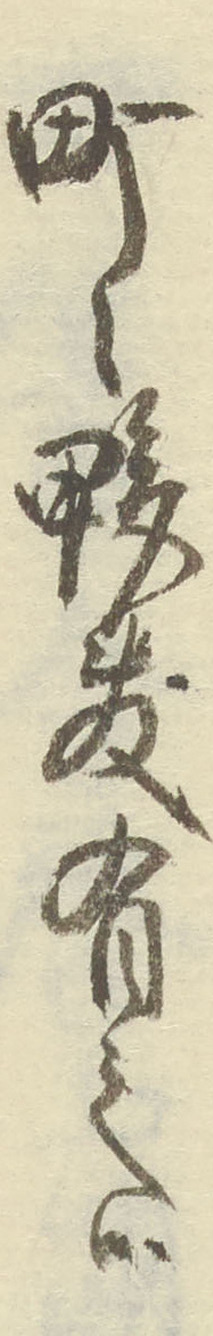町〻夥敷有之候
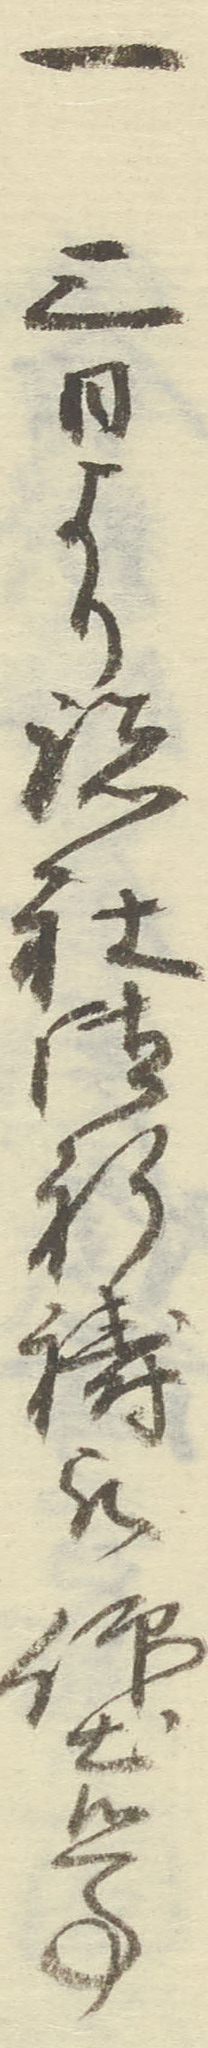一三日より諸社御祈祷被仰出候事
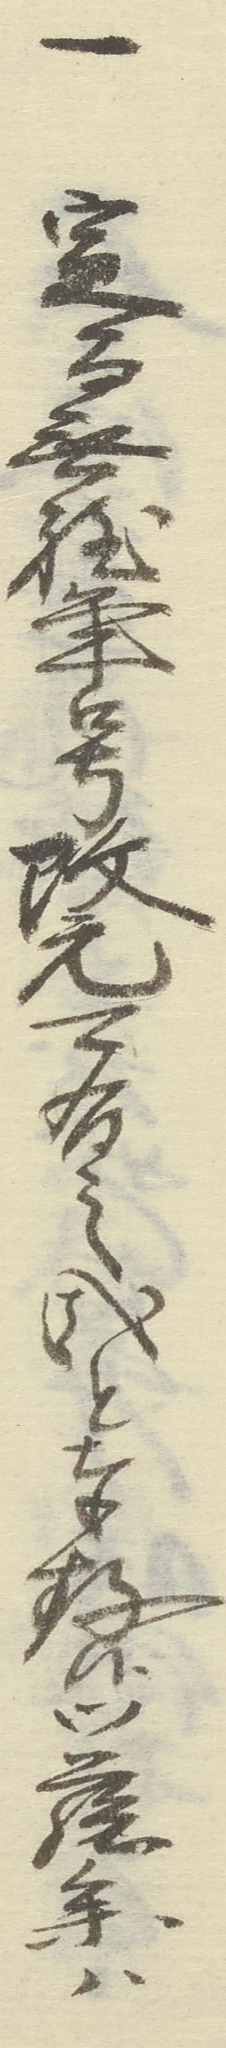一定而無程年号改元可有之哉と奉存候御蔭参ハ
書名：[七月二日京都大地震に付御番衆大木市左衛門より申し越し候書面畧書状写]
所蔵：東京大学総合図書館 General Library in the University of Tokyo, JAPAN
